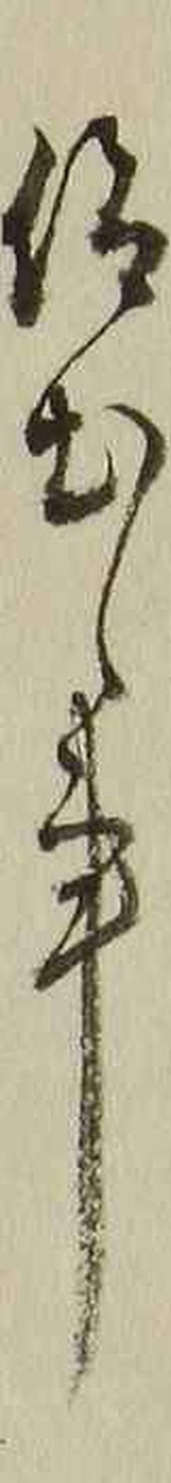仰出候事
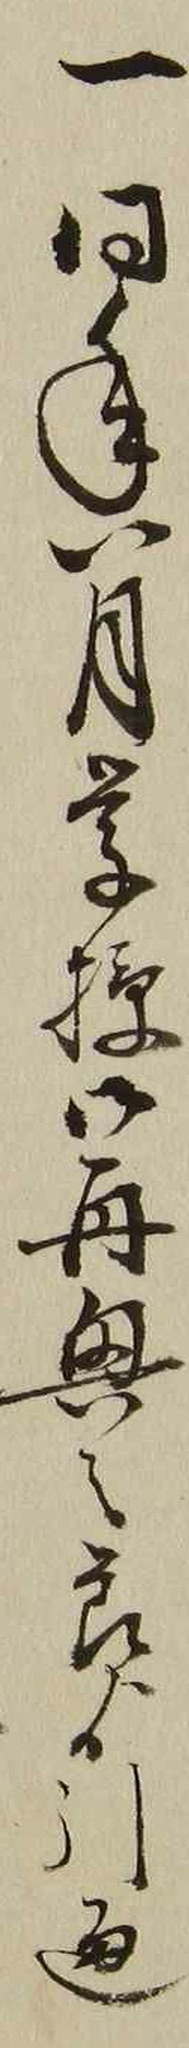一同年八月学校御再興之節ゟ引通
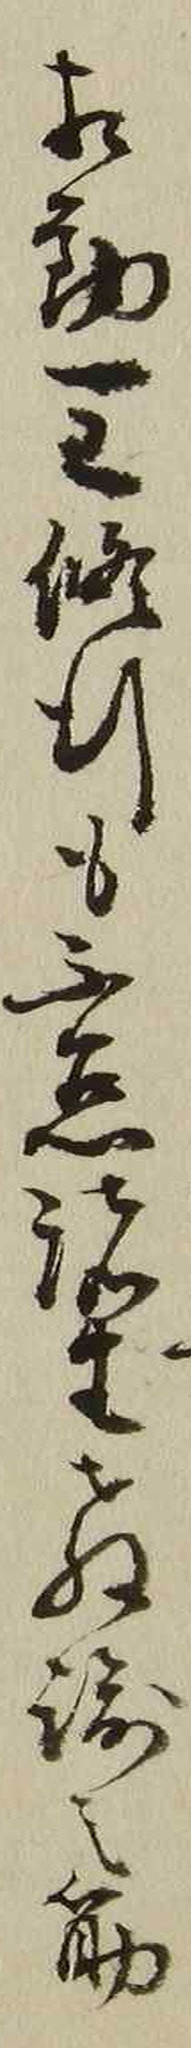相動一己修行も不怠諸生教諭之筋
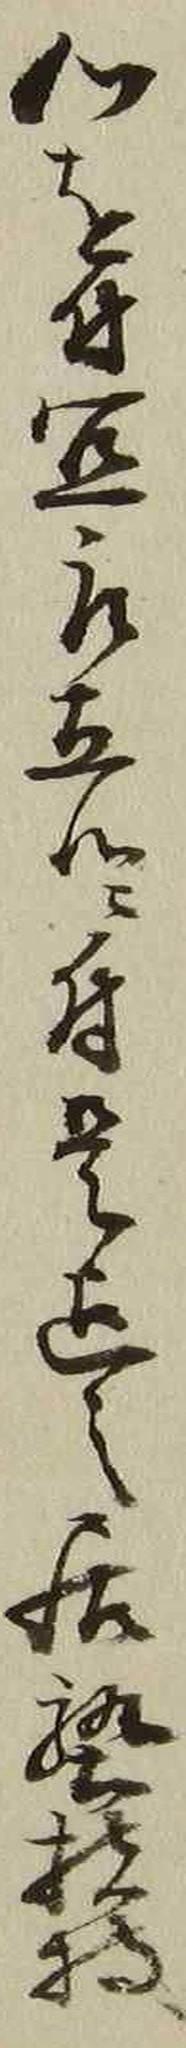心を付宜取立候ニ付是迄之居塾扶持
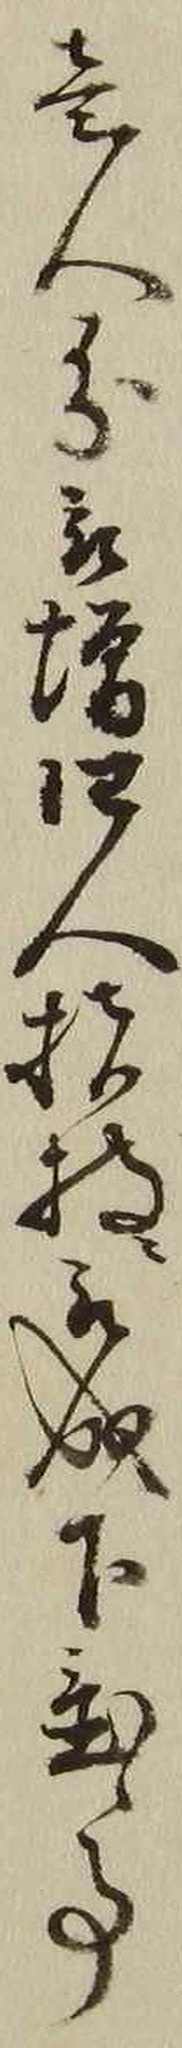壱人分被増四人扶持ニ被成下置候事
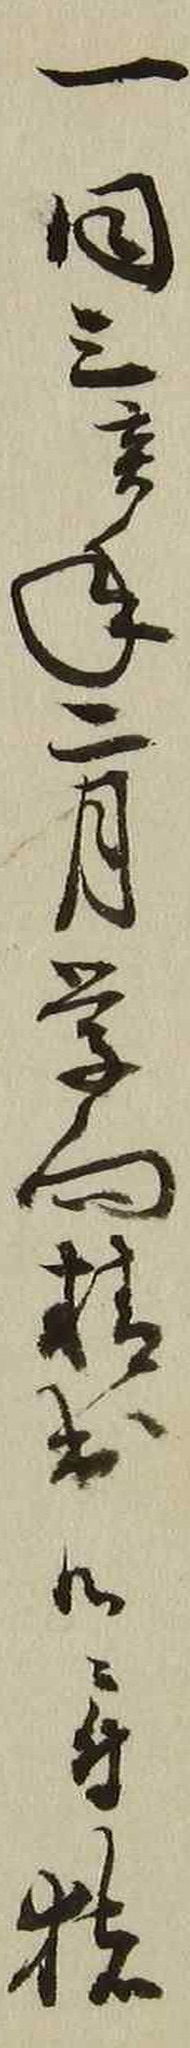一同三亥年二月学向精出候ニ付猪
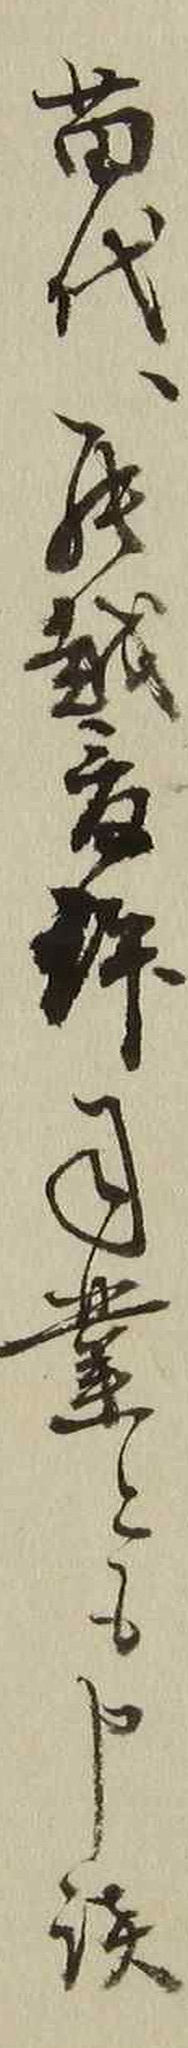苗代へ罷越爰許司業とも申談
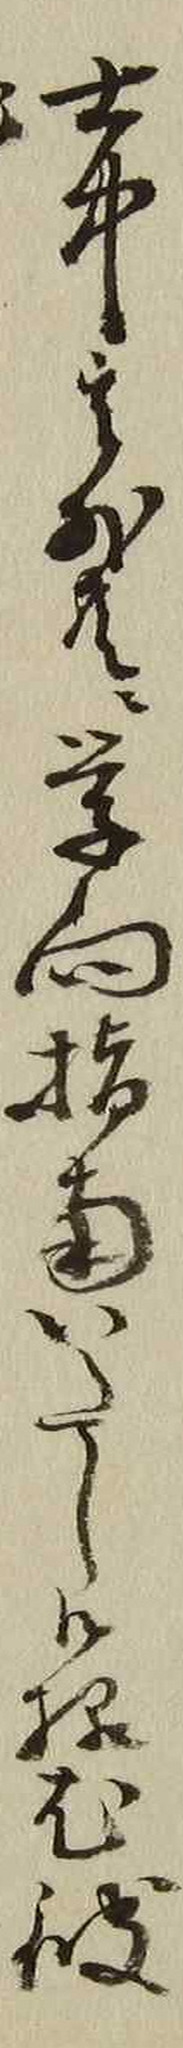士中其外共ニ学向指南いたし候様尤彼
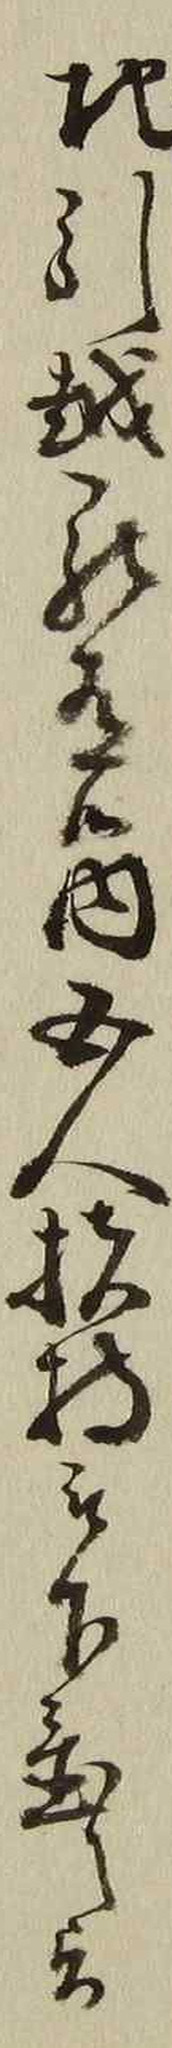地引越罷有候内五人猪持被下置之旨
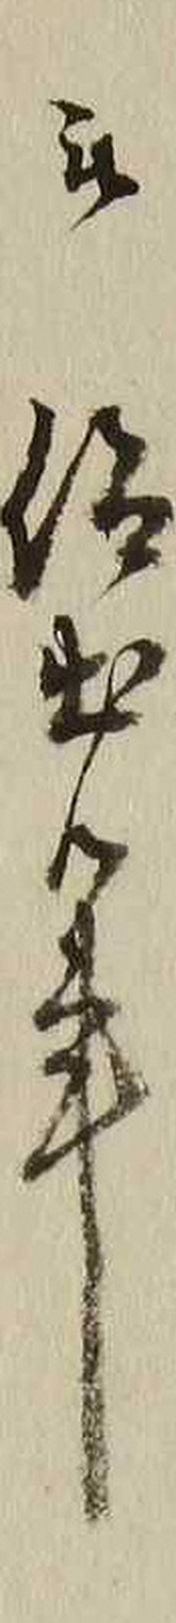被仰出候事
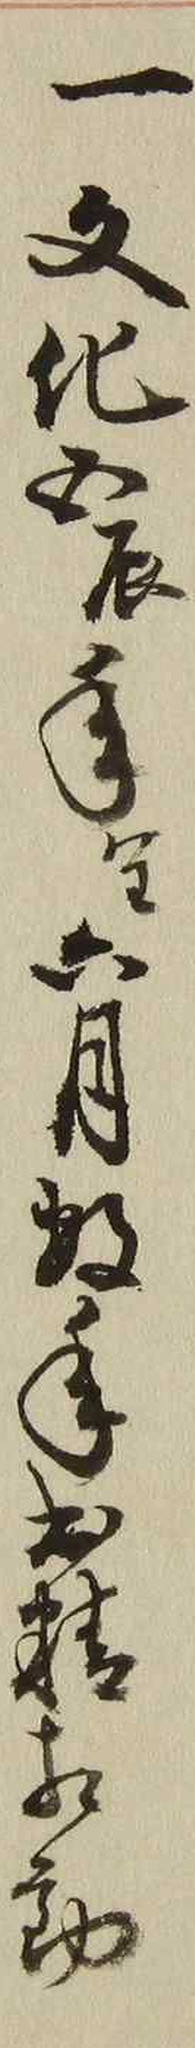一文化五辰年閏六月数年出精相勤
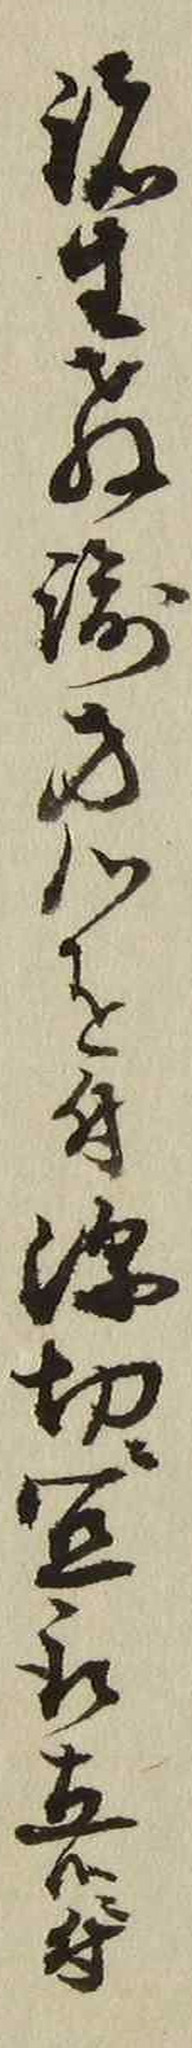諸生教諭方心を付深切ニ宜取立候ニ付
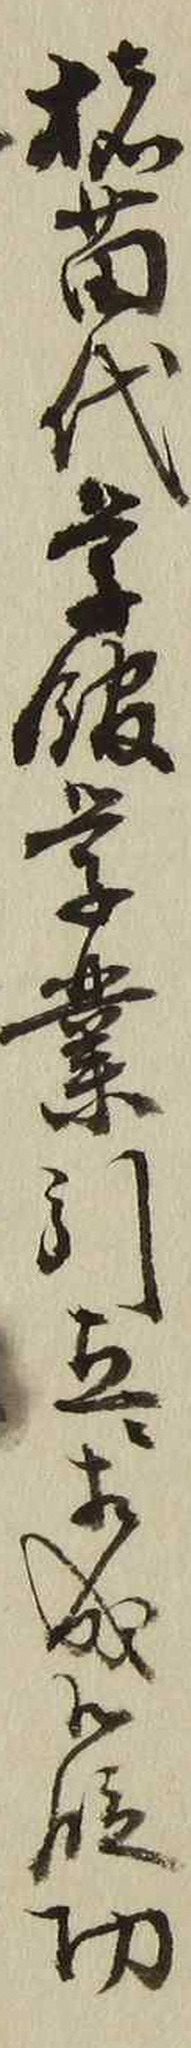猪苗代学館学業引立ニ相成候段功
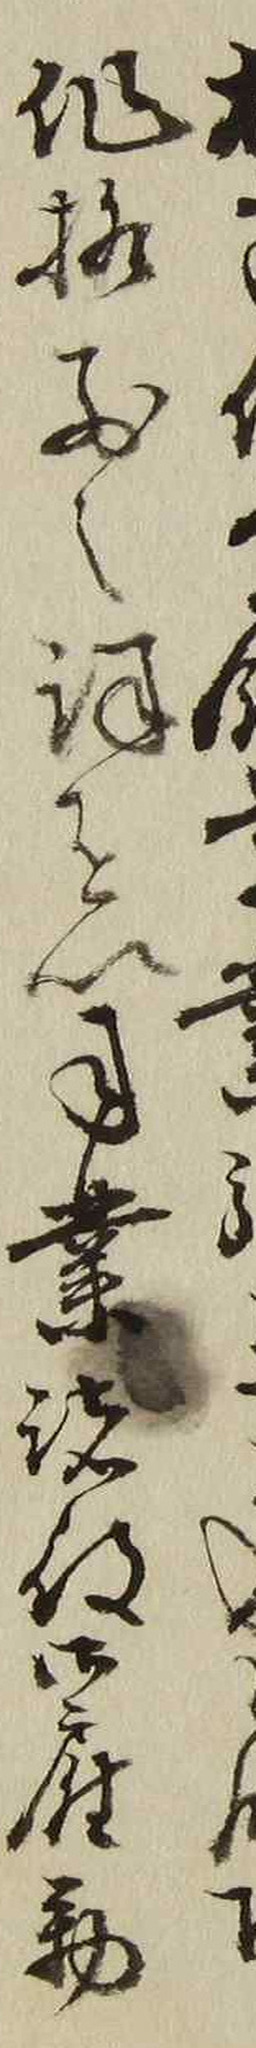作格別之訳を以司業諸役御雇勤
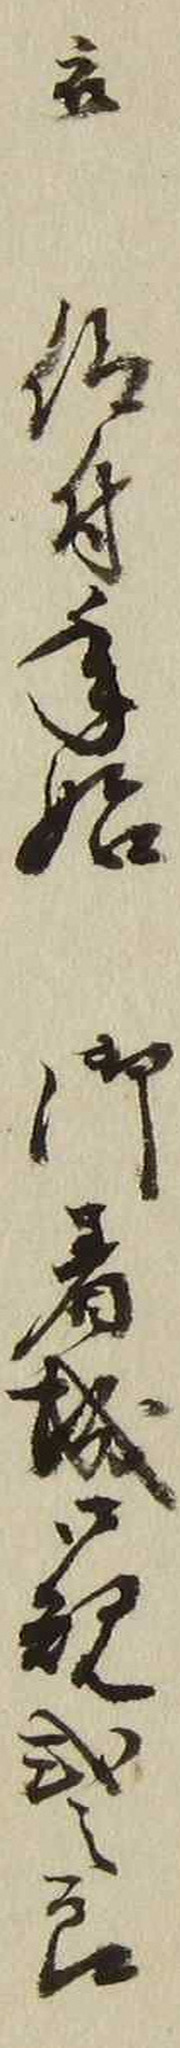被仰付年始御着城御規式之節
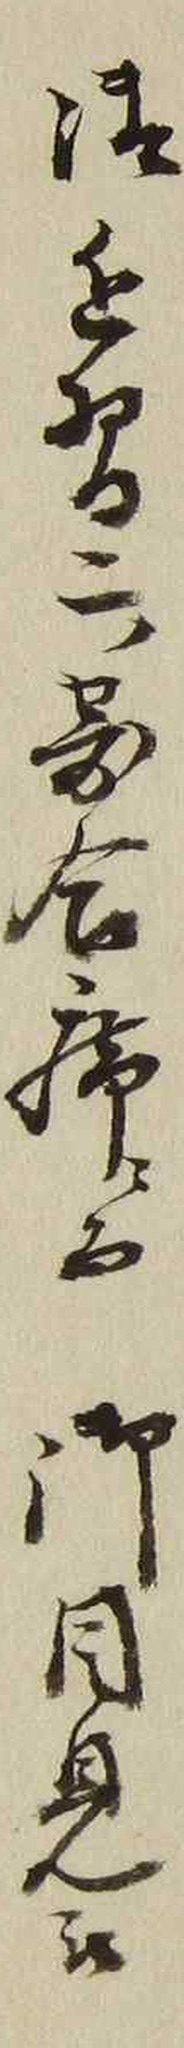御近習二ノ寄合席ニ而御目見被
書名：諸士系譜　巻之36　は之部4
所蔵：会津若松市立会津図書館
